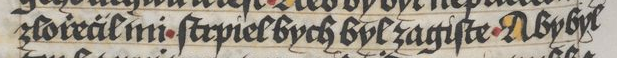zloṙeċil mi.ſtrpiel bych byl zagiſte.Aby byl
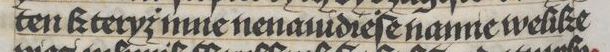ten kteryż mne nenauidíeẛe namie welike
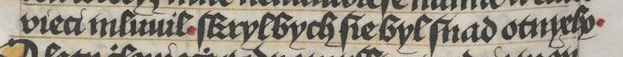vieci mliuil.ſkryl bych ſie byl ſnad otnyeho.
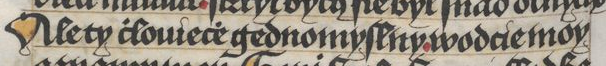Ale ty ċlouieċe gednomyſlny.wodcie moy
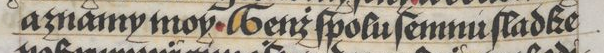a znamy moy.Genż ſpolu ſemnú ſladke
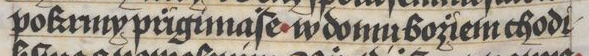pokrmy pṙigímaẛe.w domu bożiem chodi¬
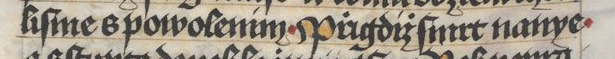liſme s powolením.Pṙigdíž ſmrt nanye.
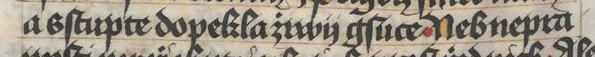a sſtupte dopekla żiwij gſuce.Neb nepra¬
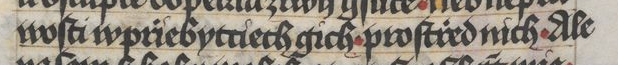woſti wpṙiebytciech gich.proſtṙed nich.Ale
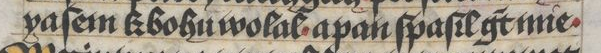ya ſem k bohu wolal.a pan ſpaſil ḡt mie.
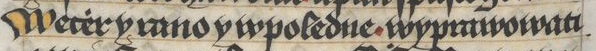Wečer y rano y wpoledne.wyprawowati
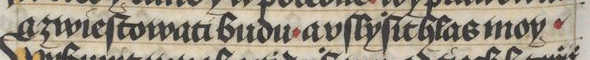a zwieſtowati budu.a vſlyẛit hlas moy.
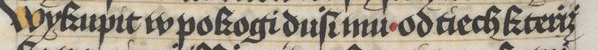Wykupit w pokogi duẛi mu.od tiech kteṙiż
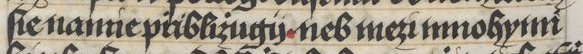ſie namie pṙibližugij.neb mezi mnohymi
